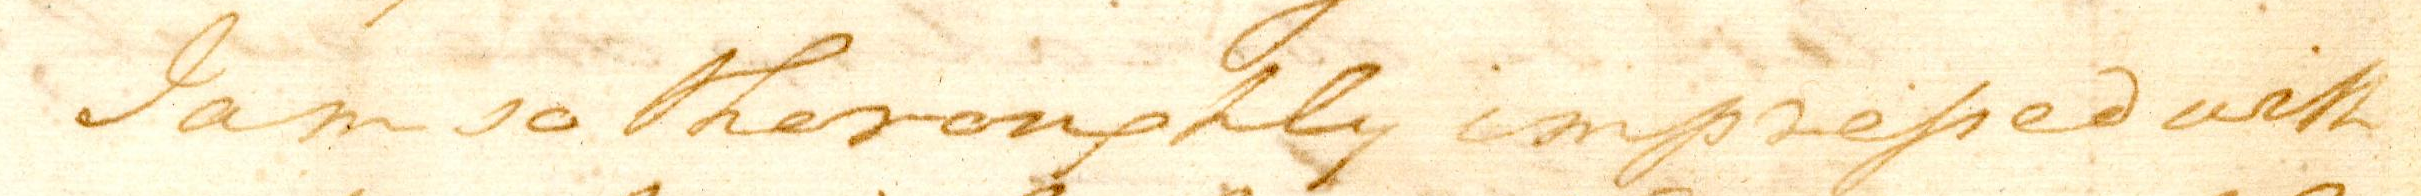I am so thoroughly impressed with
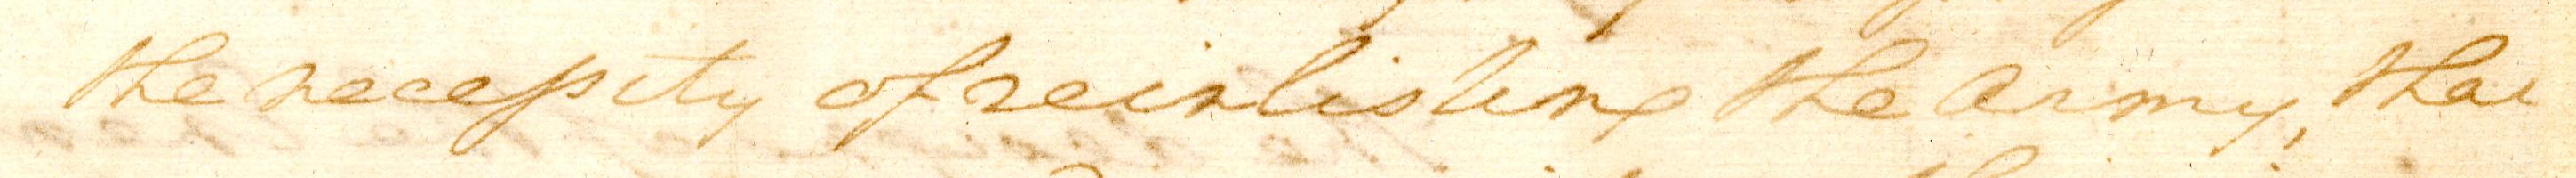the necessity of reenlisting the army that
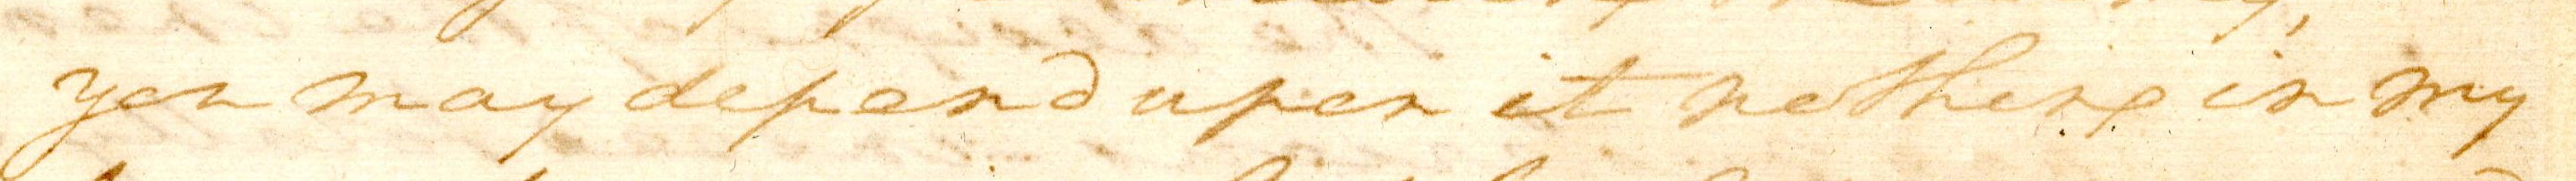you may depend upon it nothing in my
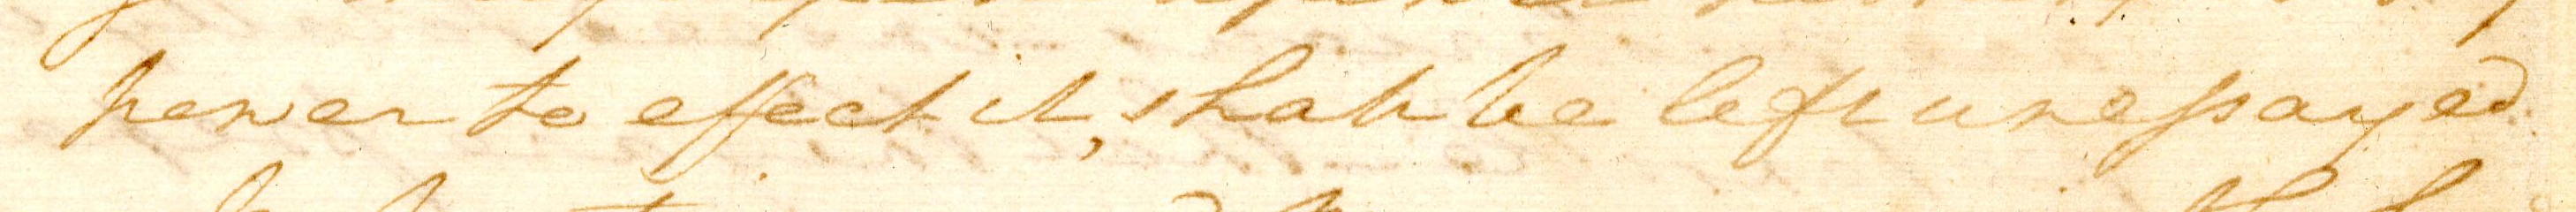power to effect it, shall be left unessayed
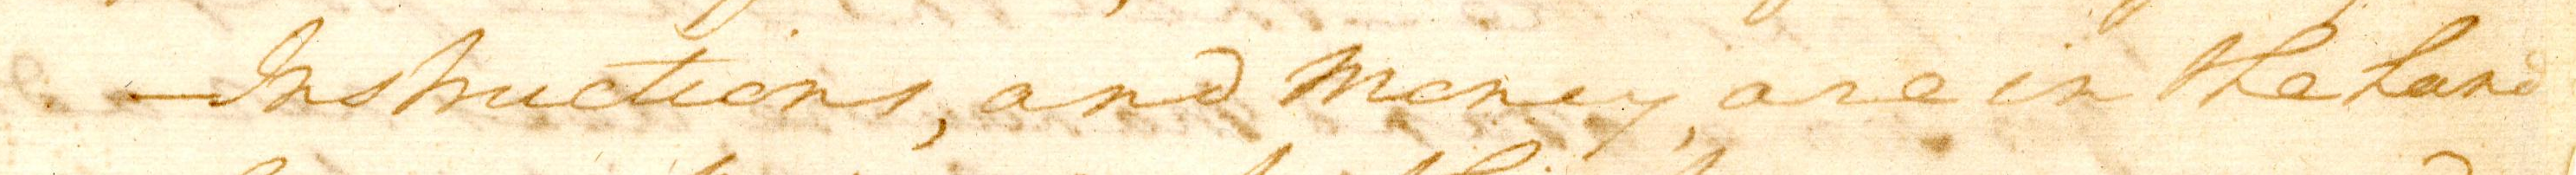Instructions, and money are in the hand
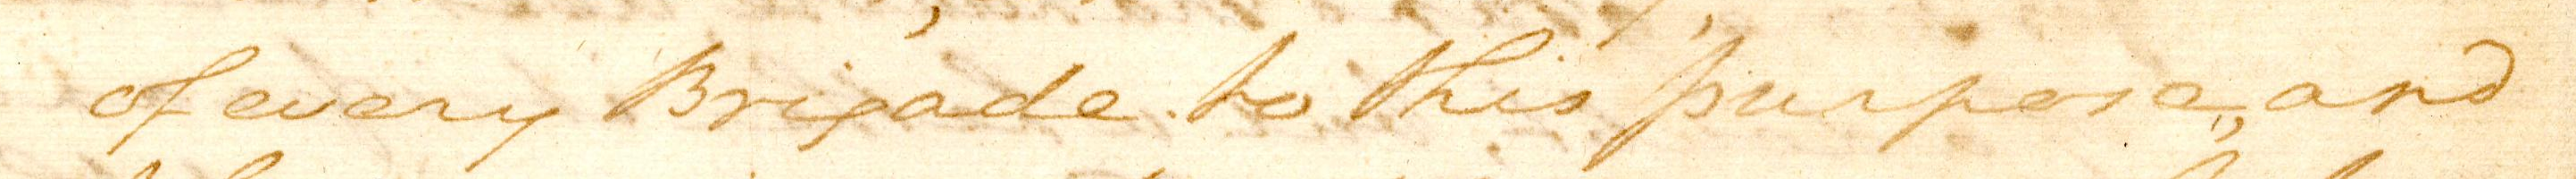of every Brigade to this purpose, and
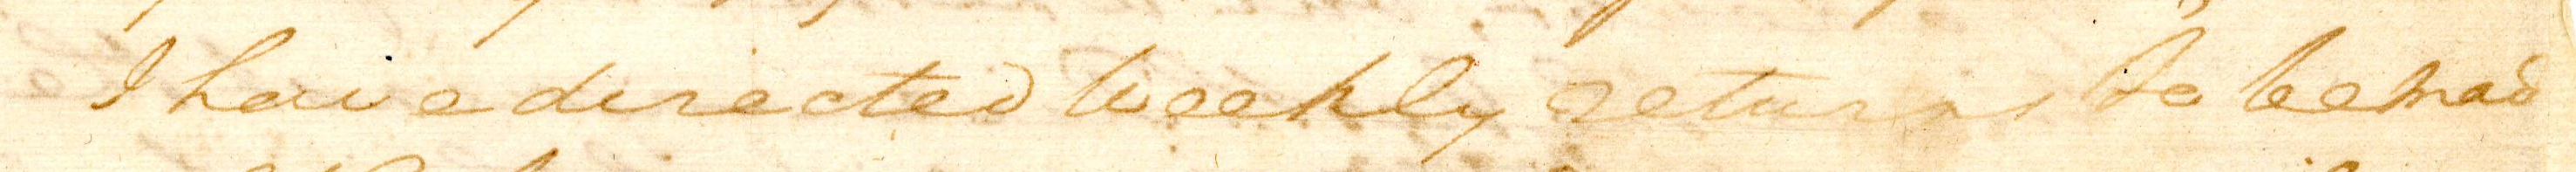I have directed weekly returns to be mad
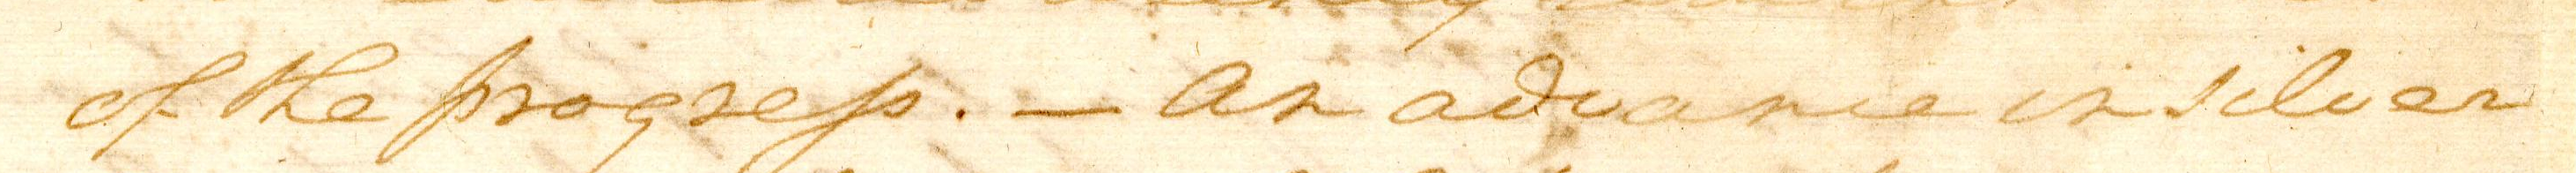of the progress.- An advance in silver
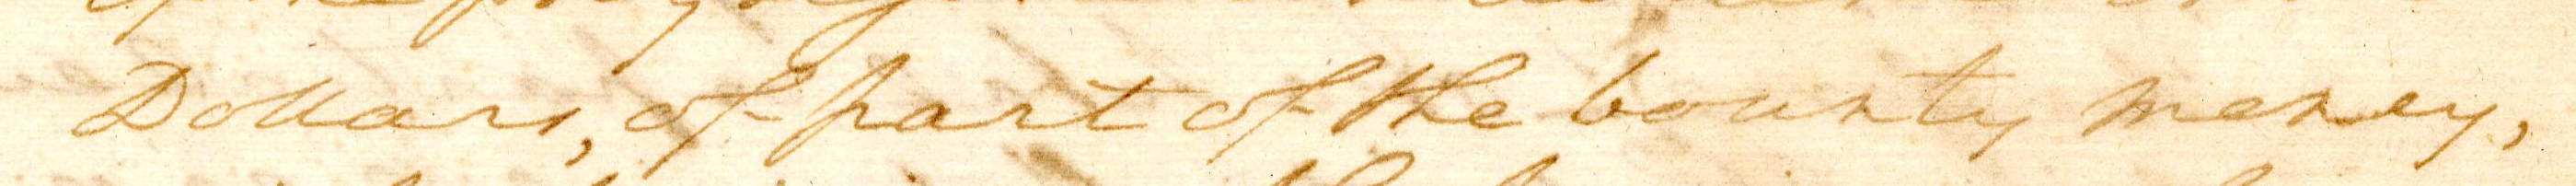Dollars, of part of the bounty money,
